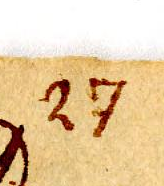27
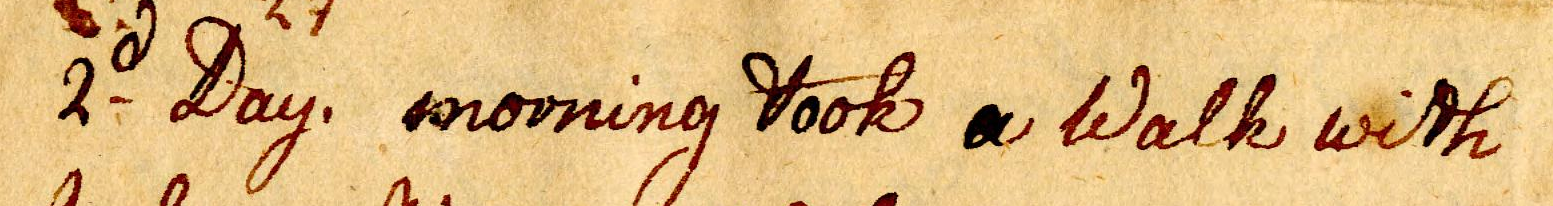2^d Day. morning took a Walk with
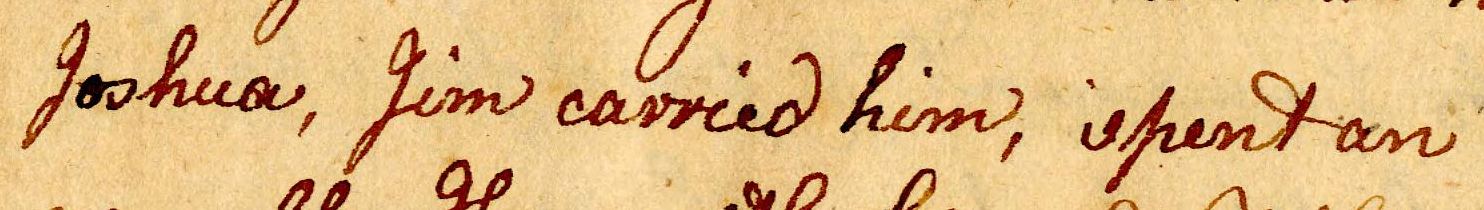Joshua, Jim carried him, spent an
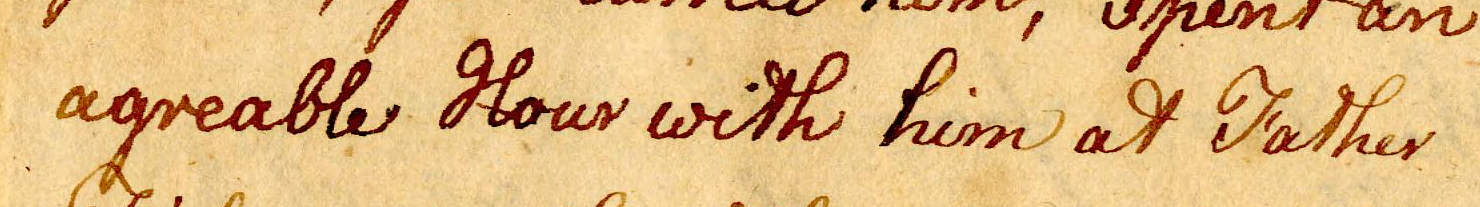agreable Hour with him at Father
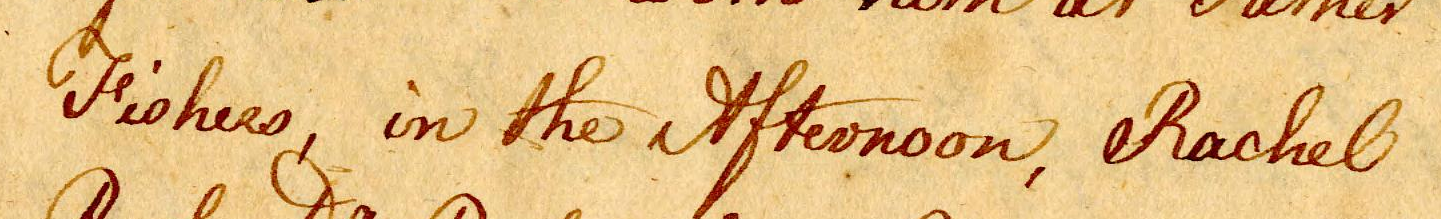Fishers, in the Afternoon, Rachel
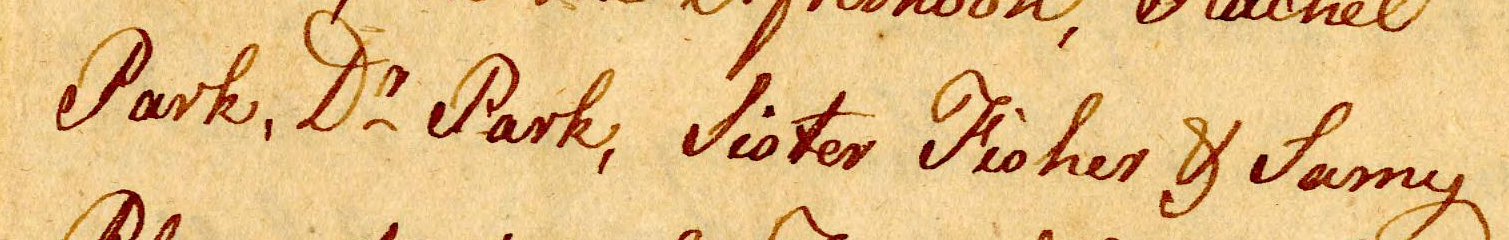Park, D^r Park, Sister Fisher & Samy
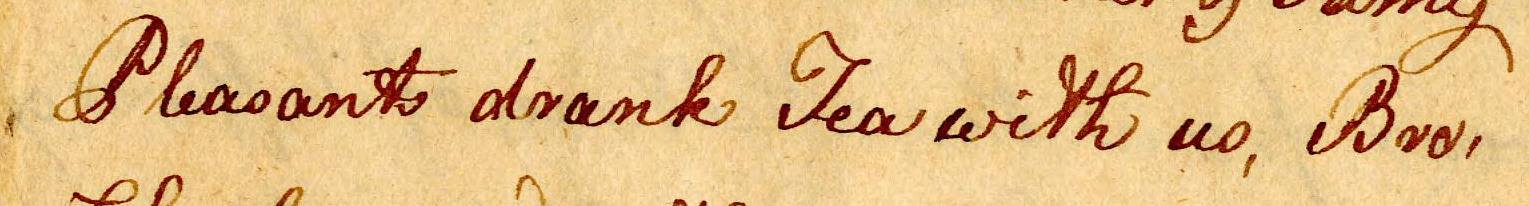Pleasants drank Tea with us, Bro,
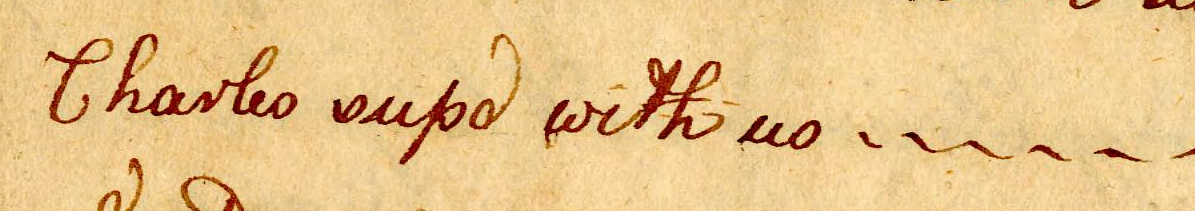Charles supd with us-
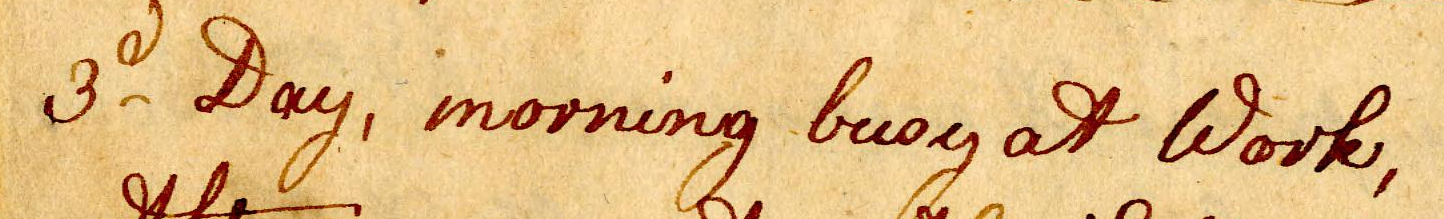3^d Day, morning busy at Work,
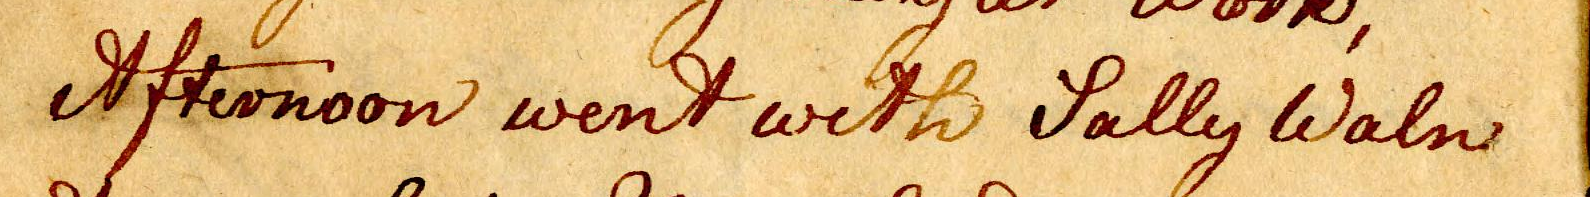Afternoon went with Sally Waln
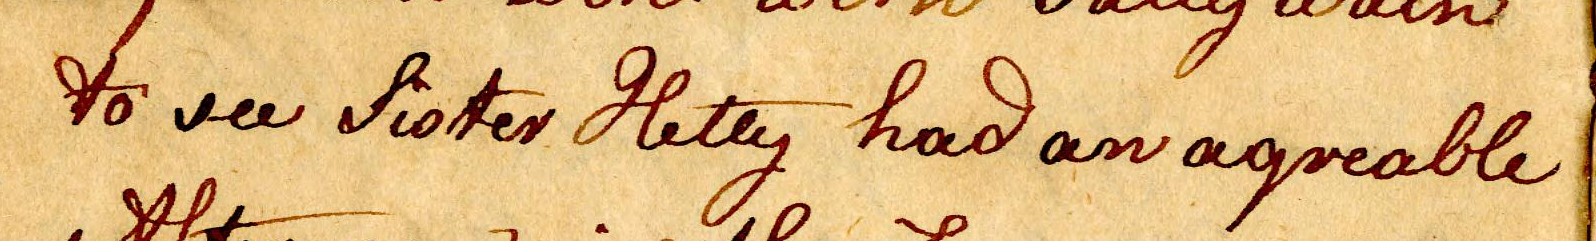to see Sister Hetty had an agreable
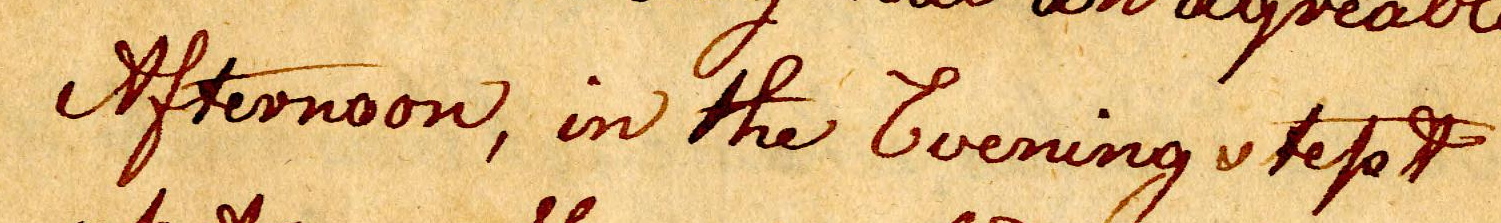Afternoon, in the Evening stept
